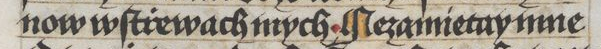now wſtṙewach mych.Nezamíetay mne
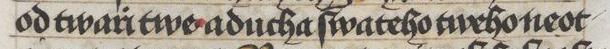od twaṙi twe.a ducha ſwateho tweho neot¬
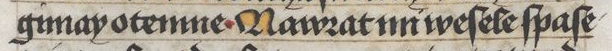gimay otemne.Nawrat mi weſele ſpaſe¬
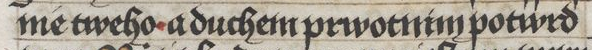níe tweho.a duchen prwotním potwrd
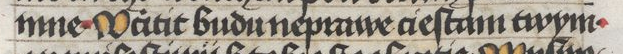mne.Vċitít budu neprawe cieſtam twym.
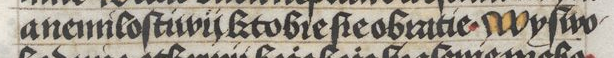a nemiloſtiwij ktobie ſie obratie.Wyſwo¬
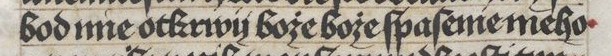bod mie otkrwij boże boże ſpaſeníe meho.
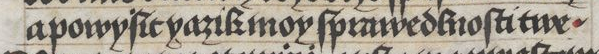a powyẛit yazik moy ſprawedlnoſti twe.
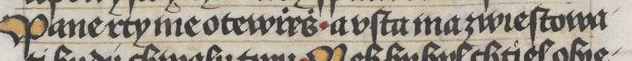Pane rty me otewṙeṡ.a vſta ma zwieſtowa¬
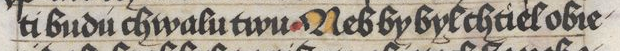ti budú chwalu twu.Neb by byl chtiel obie¬
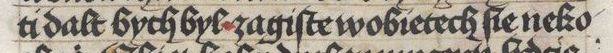ti dalt bych byl.zagiſte w obíetech ſie neko¬
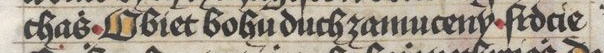chaṡ.Obiet bohu duch zamuceny.ſrdcie
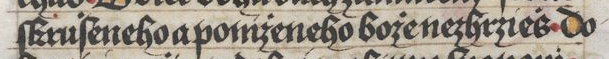ſkruẛeneho a poníżeneho boże nezhrzieṡ.Do¬
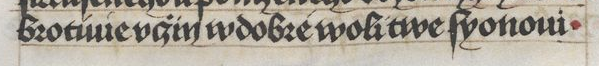brotíuie vcżin w dobré woli twe ſyonoui.
